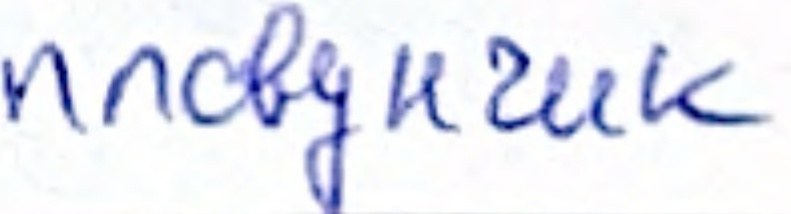пловунчик
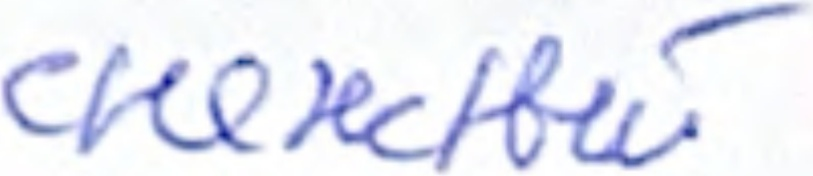снежный
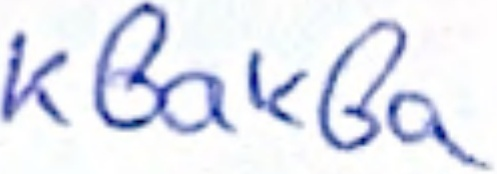кваква
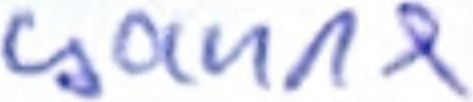цапля
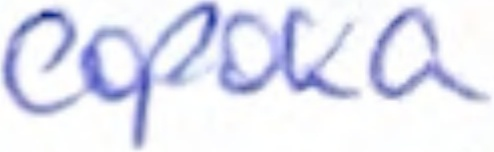сорока
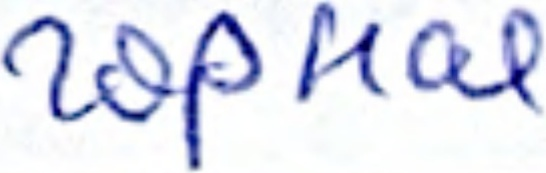горная
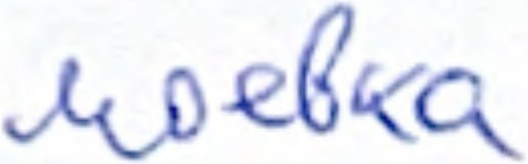моевка
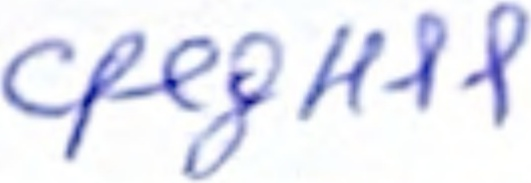средняя
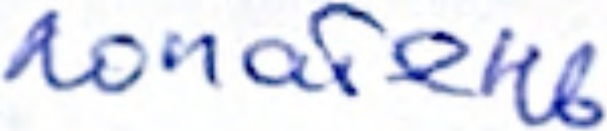лопатень
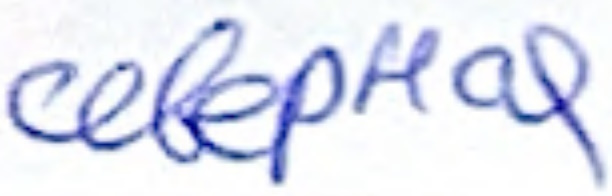северная
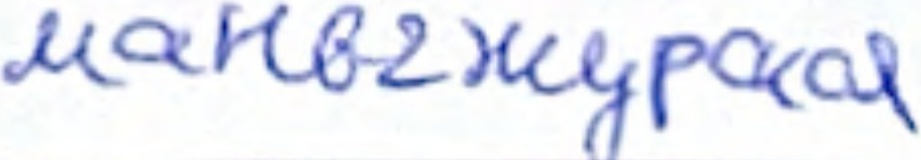маньчжурская
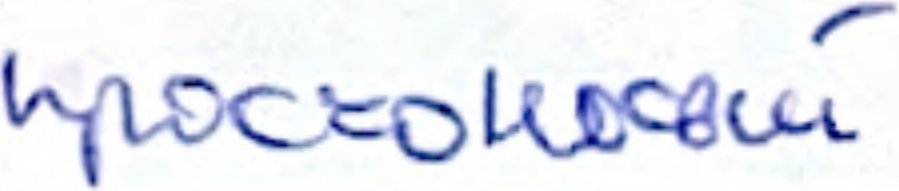просконосый
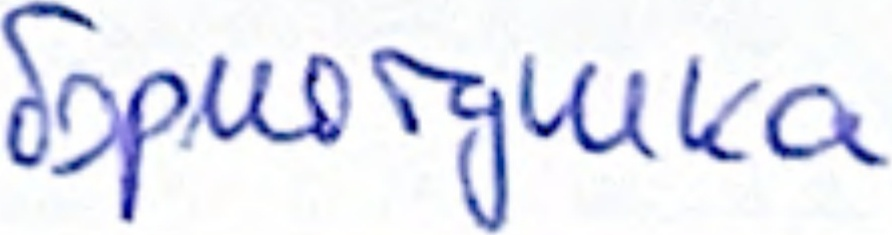бормотушка
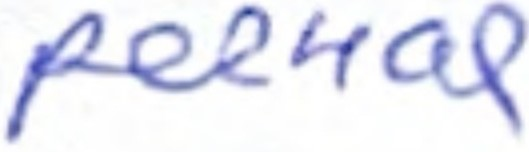речная
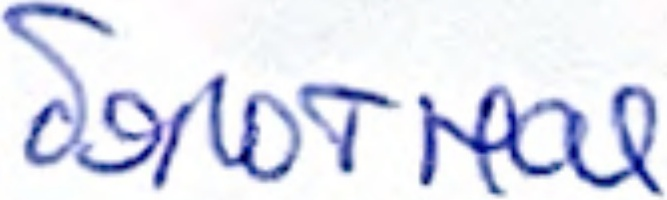болотная
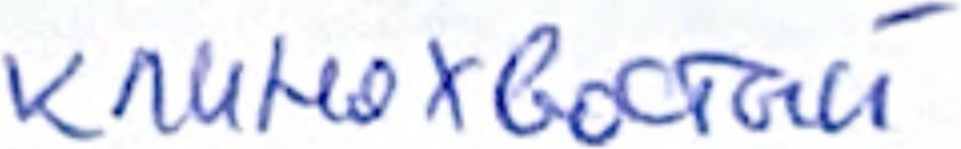клинохвостый
